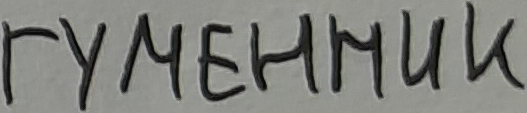гуменник
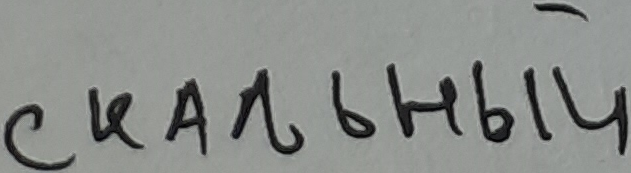скальный
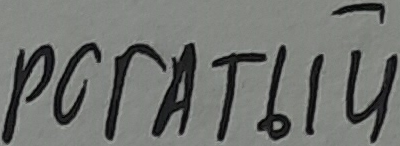рогатый
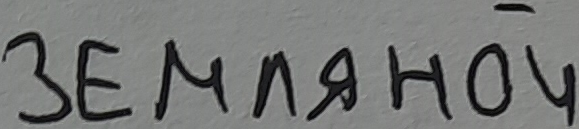земляной
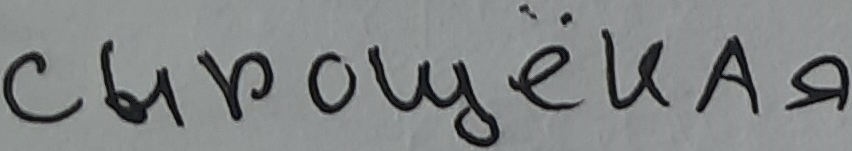сырощёкая
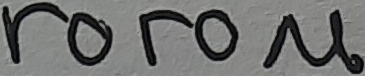гоголь
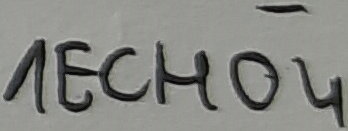лесной
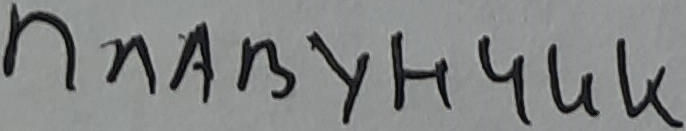плавунчик
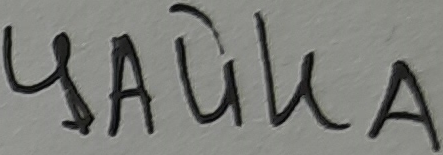чайка
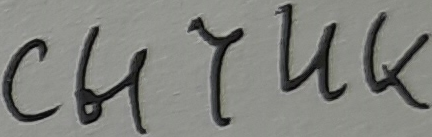сычик
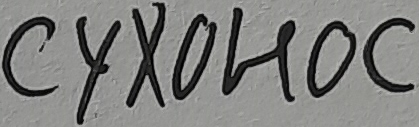сухонос
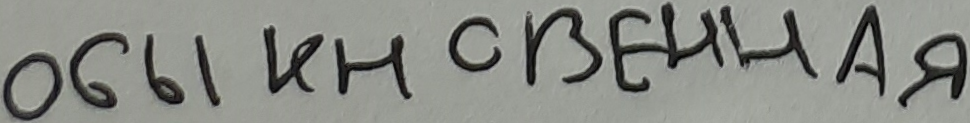обыкновенная
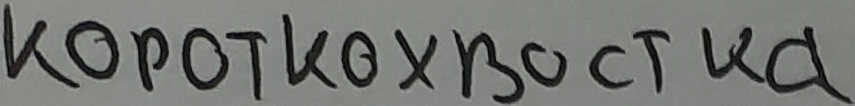короткохвостка
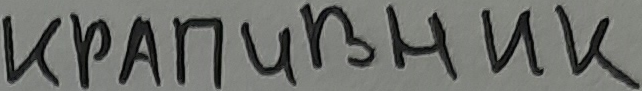крапивник
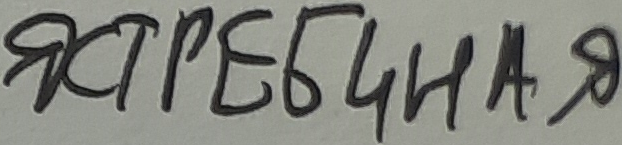ястребиная
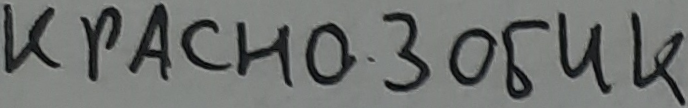краснозобик
